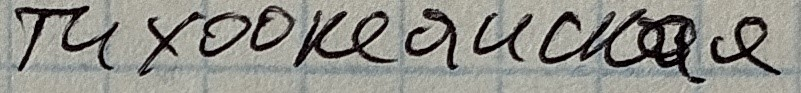тихоокеанская
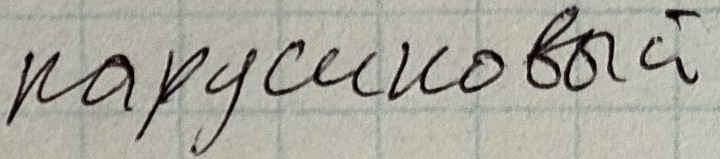парусиновый
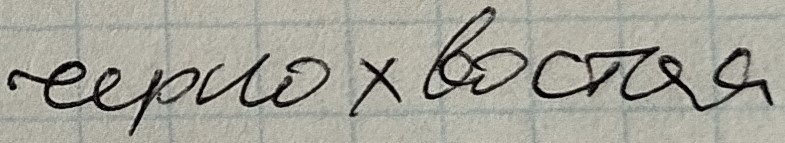чернохвостая
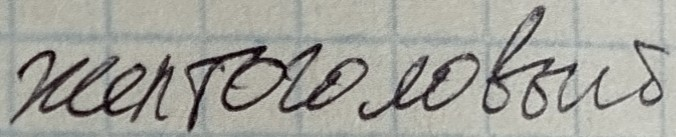желтоголовый
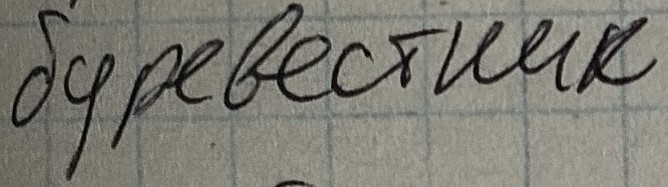буревестник
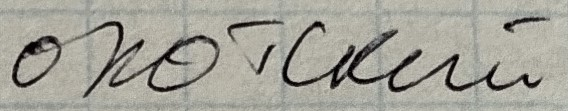охотский
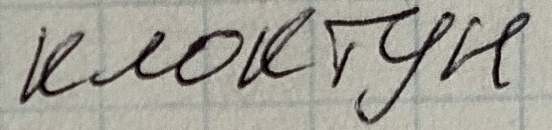клоктун
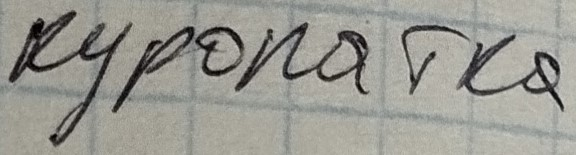куропатка
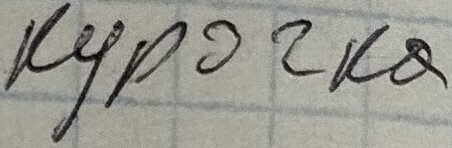курочка
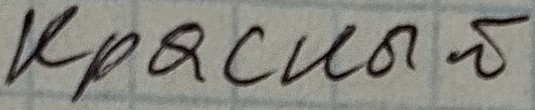красный
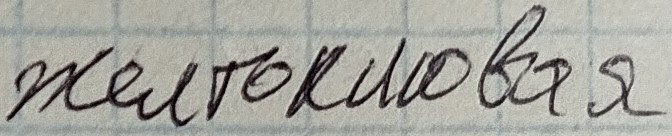желтоклювая
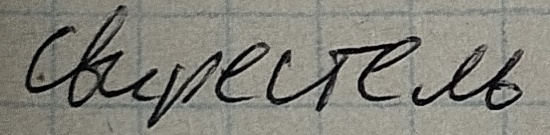свирестель
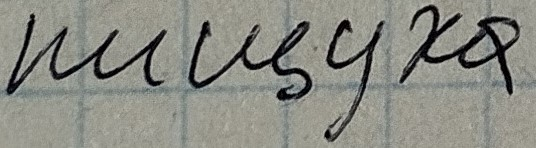пищуха
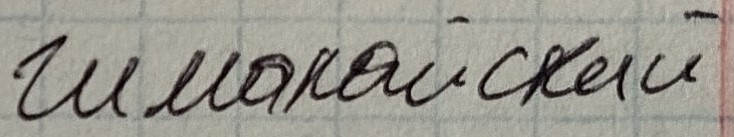гималайский
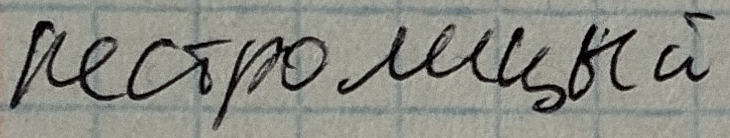пестролицый
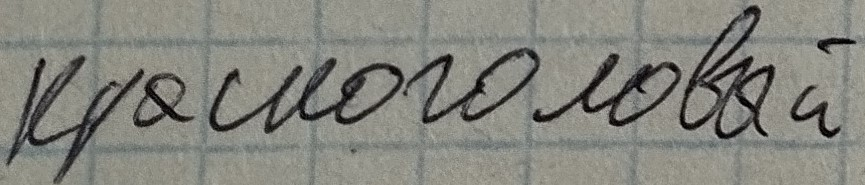красноголовый
